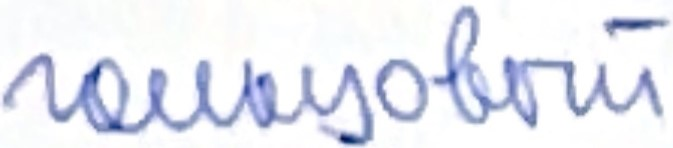гольцовый
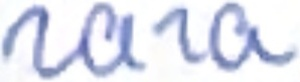гага
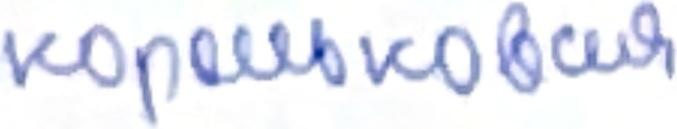корольковая
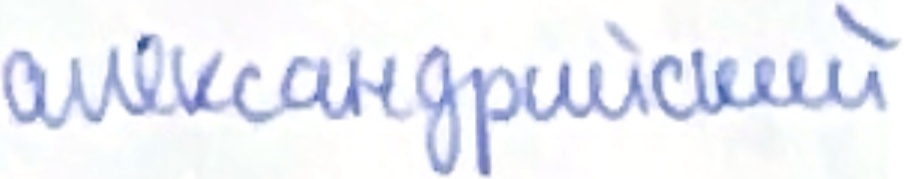александрийский
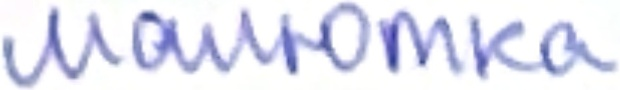малютка
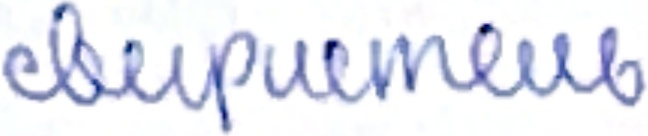свиристель
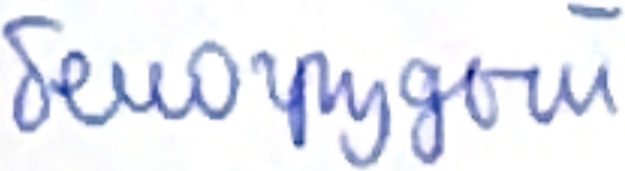белогрудый
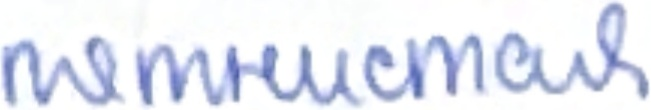пятнистая
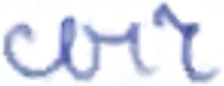сыч
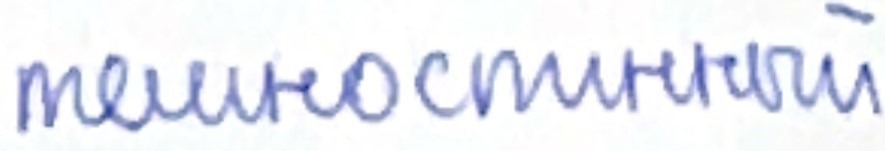темноспинный
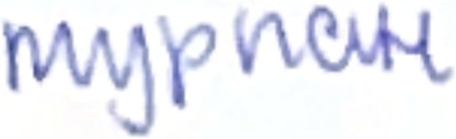турпан
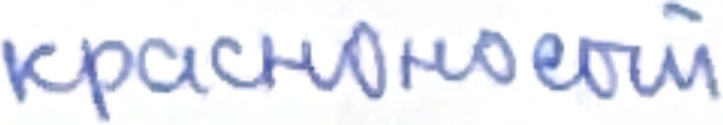красноносый
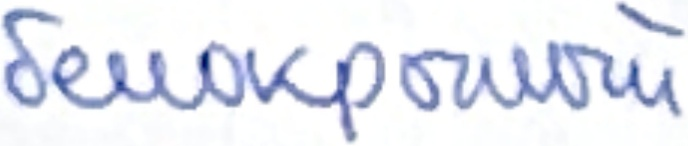белокрылый
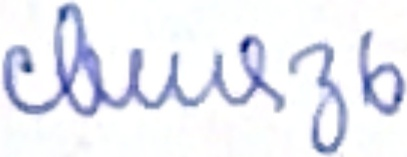свиязь
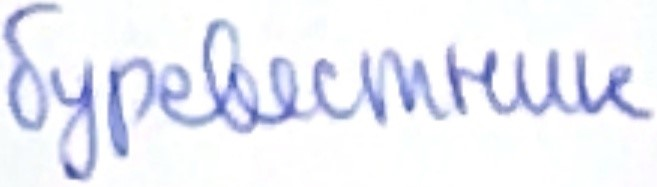буревестник
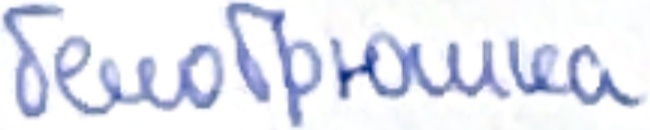белобрюшка
